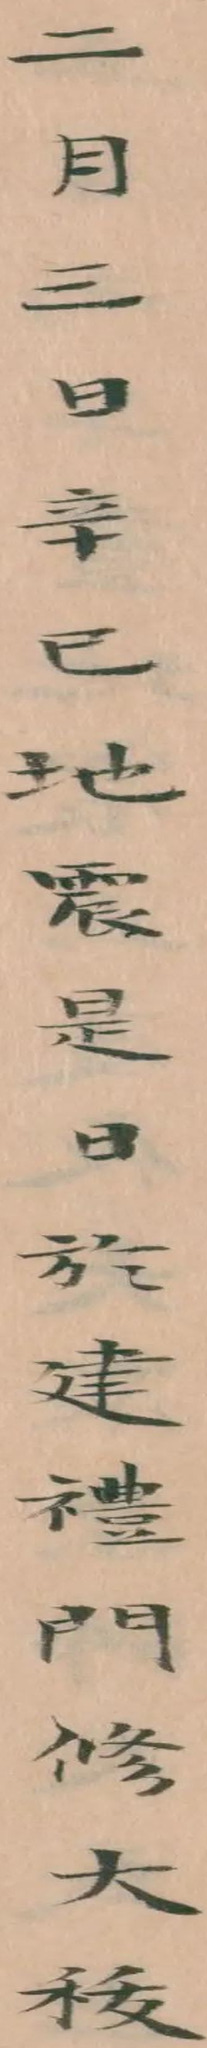二月三日辛巳地震是日建礼門修大祓
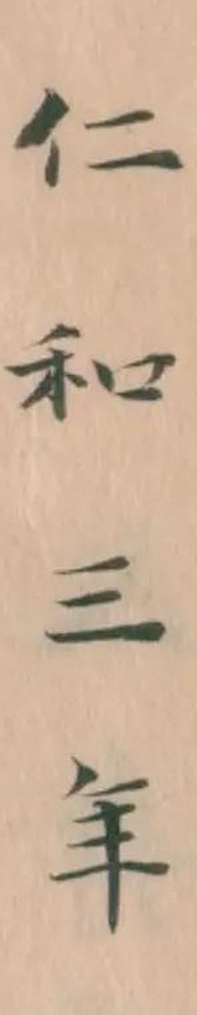仁和三年
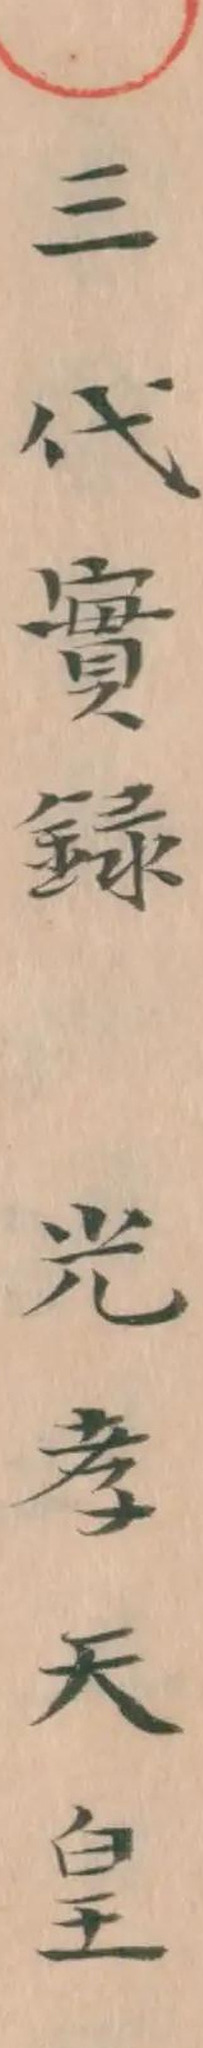○三代実録光孝天皇
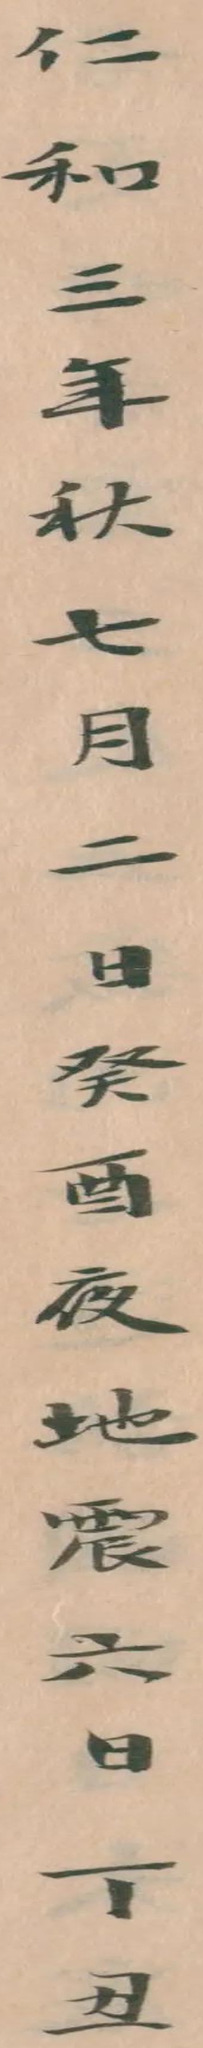仁和三年秋七月二日癸酉夜地震六日丁丑
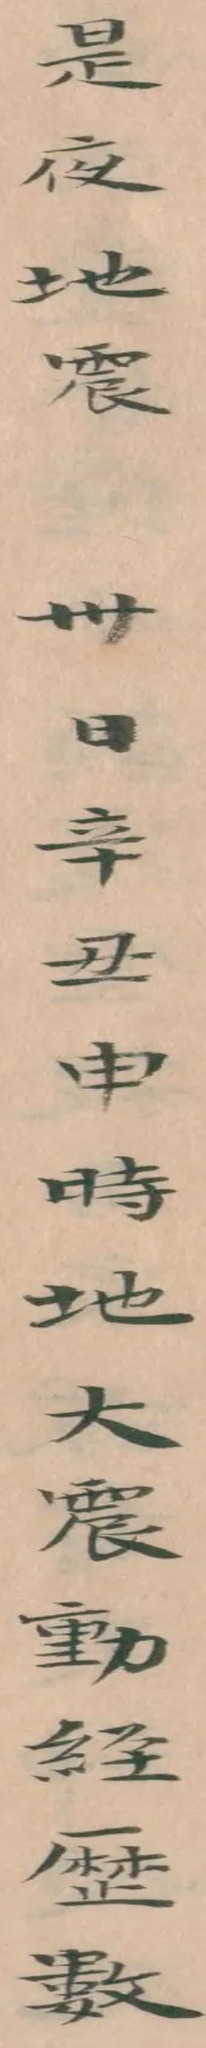是夜地震丗日辛丑申時地大震動経歴数
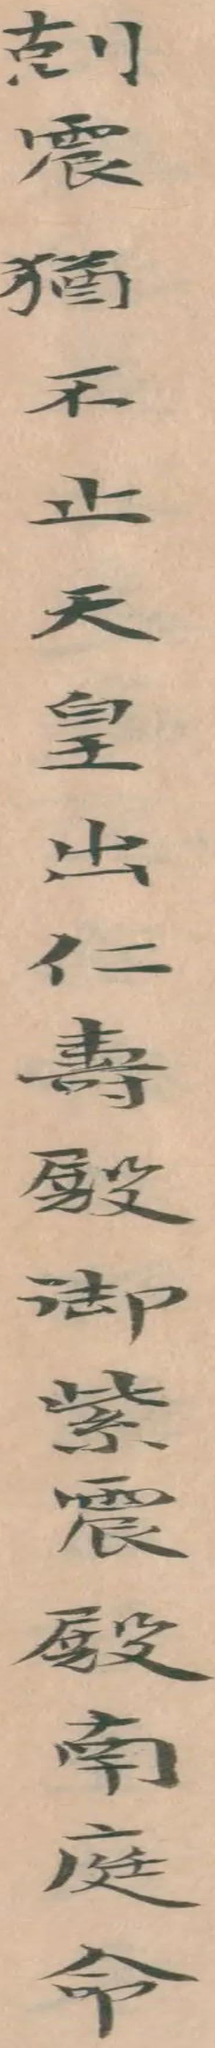剋震猶不止天皇出仁寿殿御紫震殿南庭命

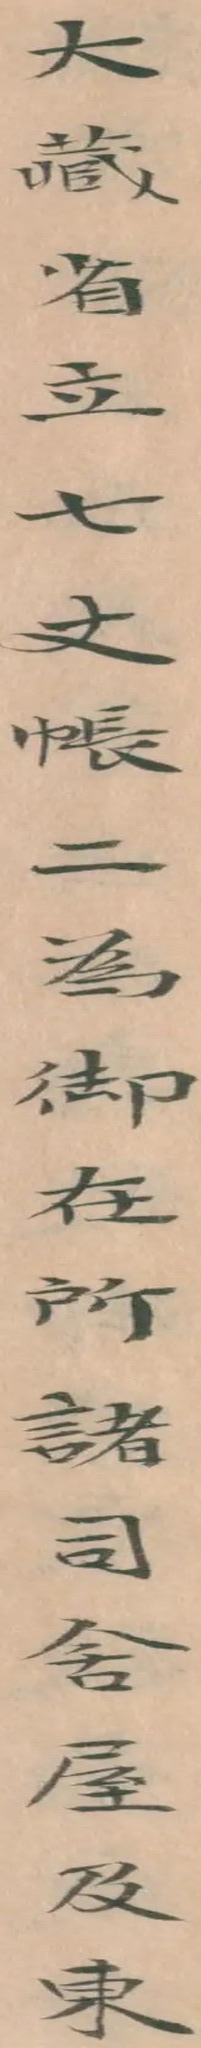大蔵省立七丈帳二為御在所諸司舎屋及東
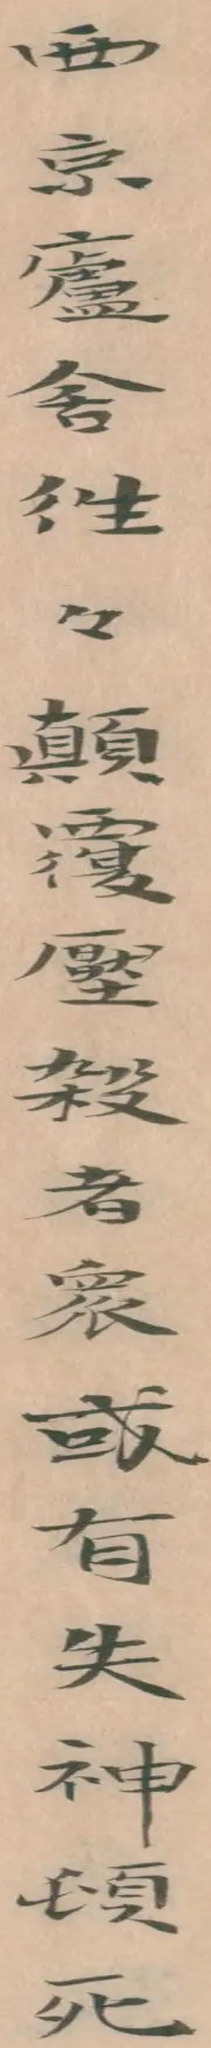西京廬舎往々顛覆圧殺者衆或有失神頓死
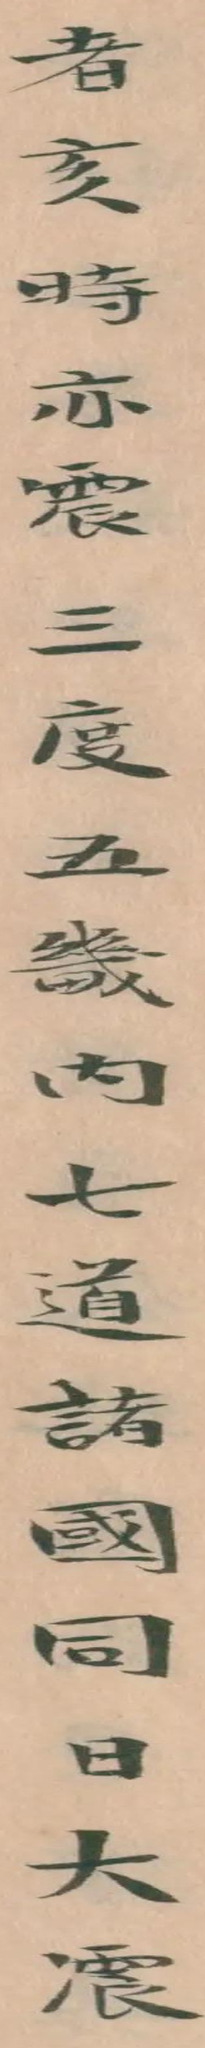者亥時亦震三度五畿内七道諸国同日大震
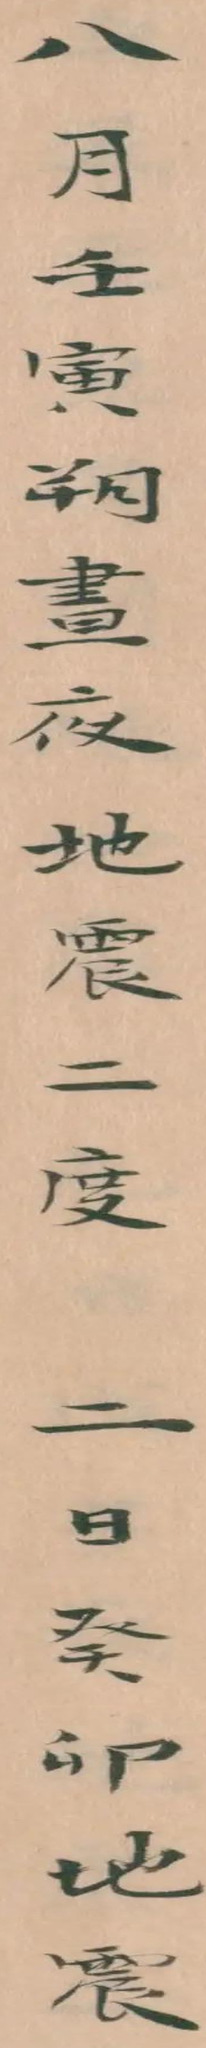八月壬寅朔昼夜地震二度二日癸卯地震
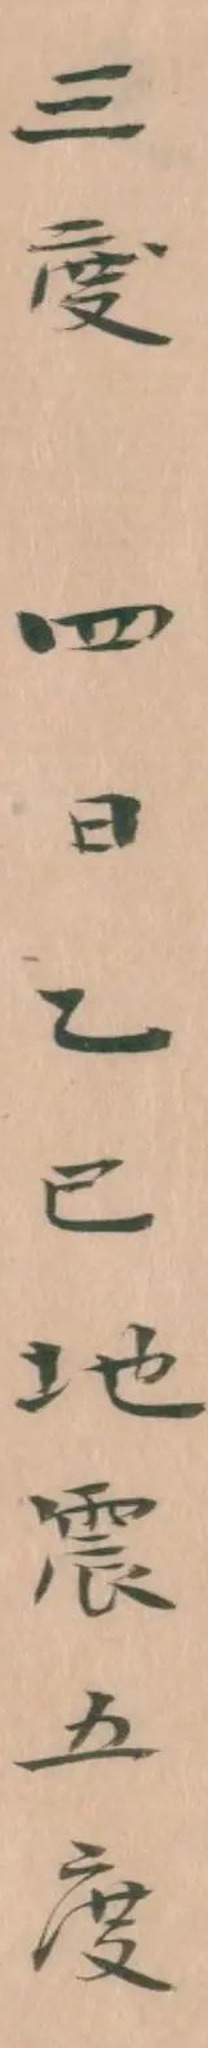三度四日乙巳地震五度
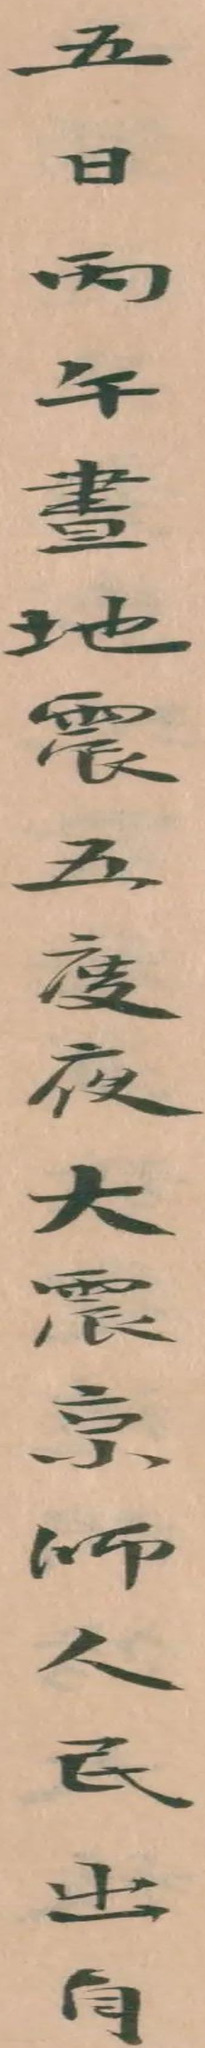五日丙午昼地震五度夜大震京師人民出自
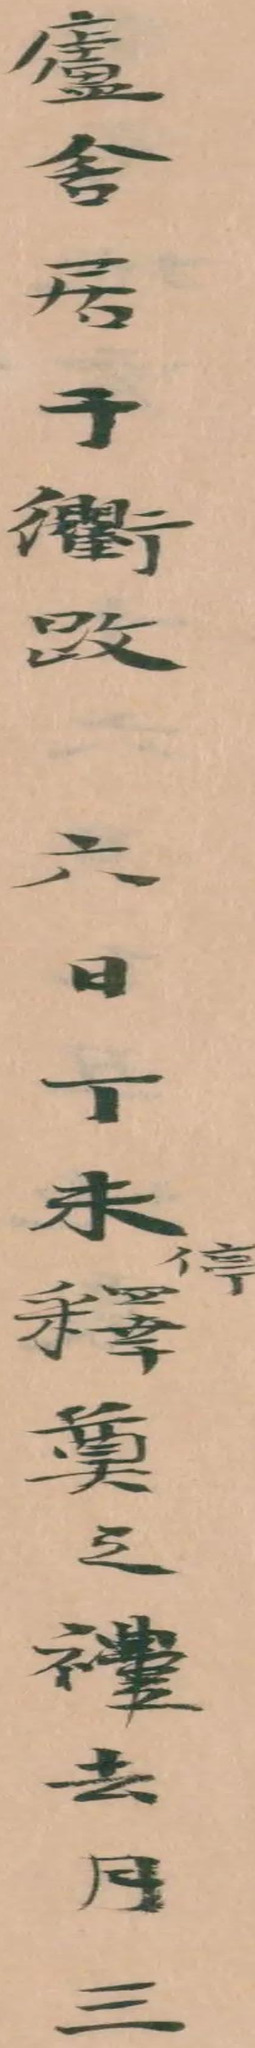盧舎居于衢路六日丁未停釈奠之礼去月三
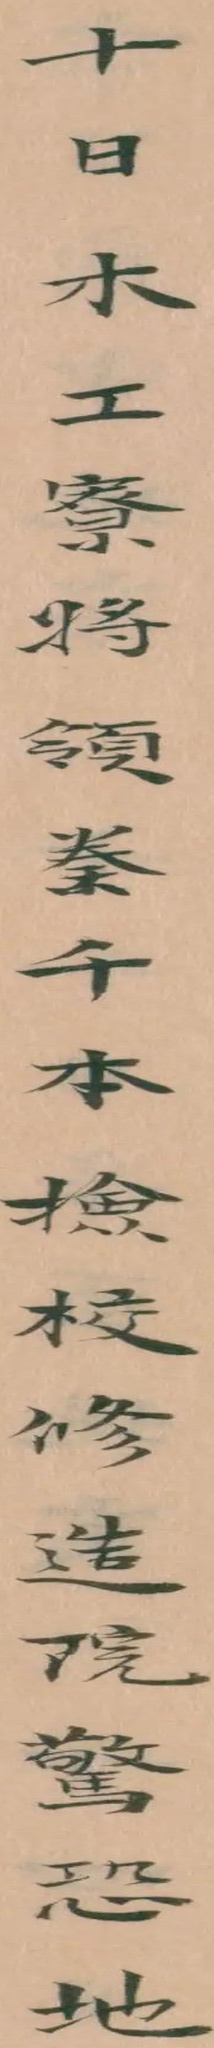十日木工寮将領秦千本撿校修造院驚恐地
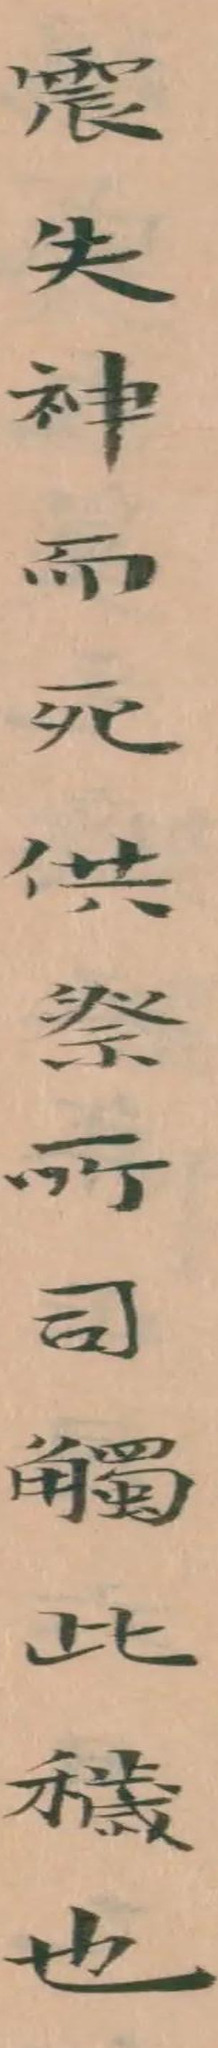震失神而死供祭所司触此穢也
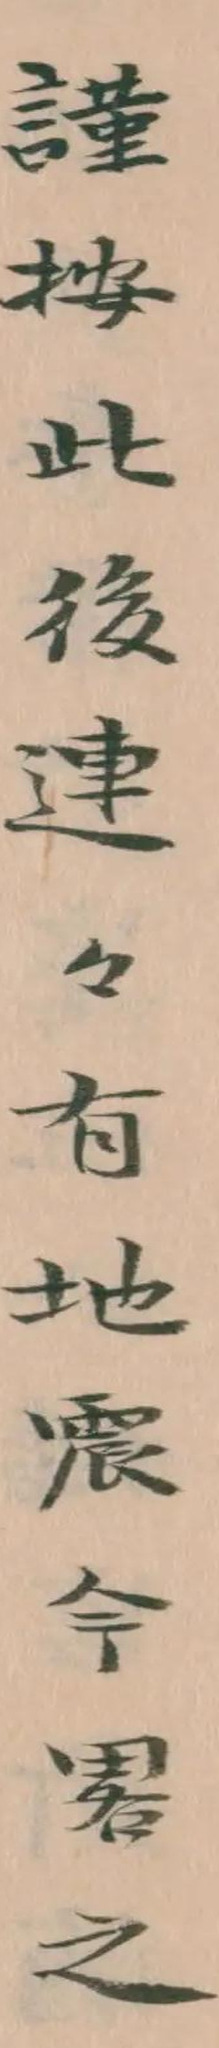謹按此後連々有地震今略之
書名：地災撮要. 巻5-6(地震之部)
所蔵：国立国会図書館 National Diet Library, JAPAN
